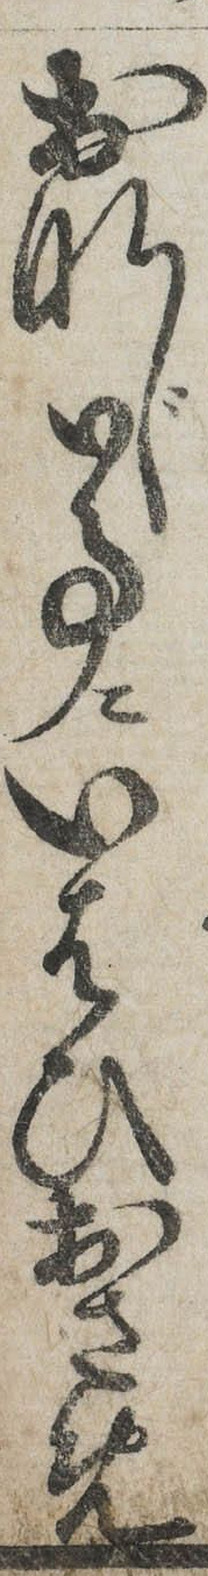おなじ御事にいはひおさめ

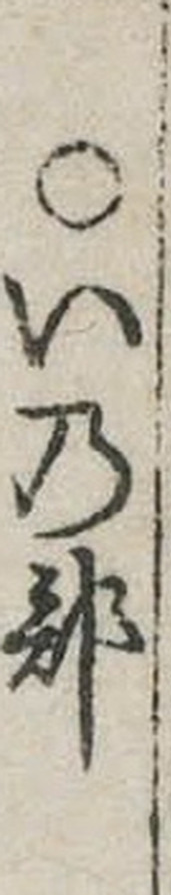○いの部
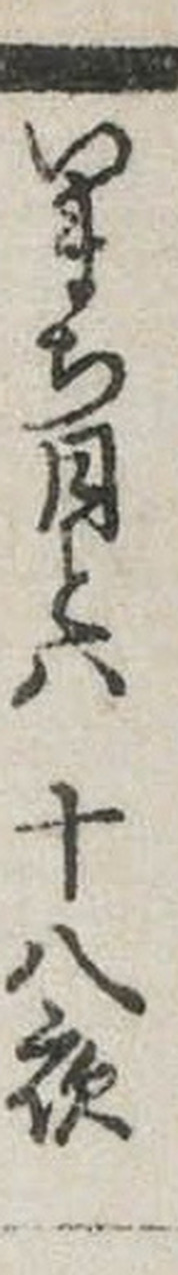いまち月とは十八夜
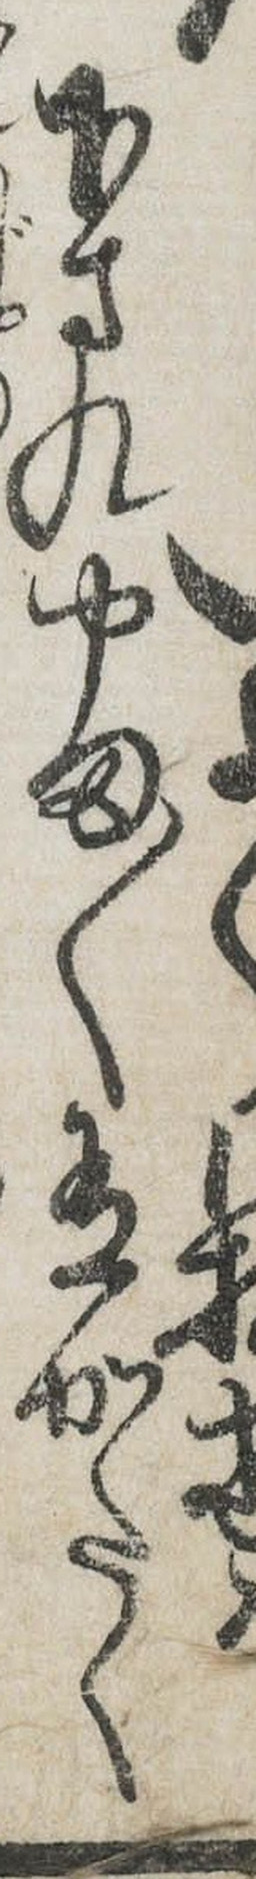下されやま〳〵有がたく
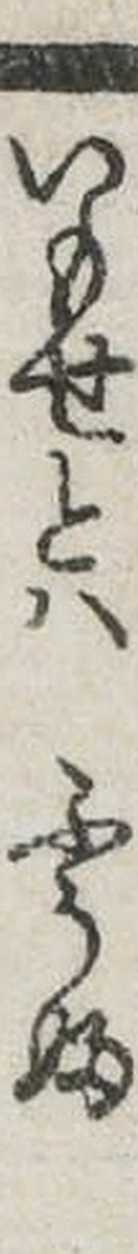いもせとはふうふ
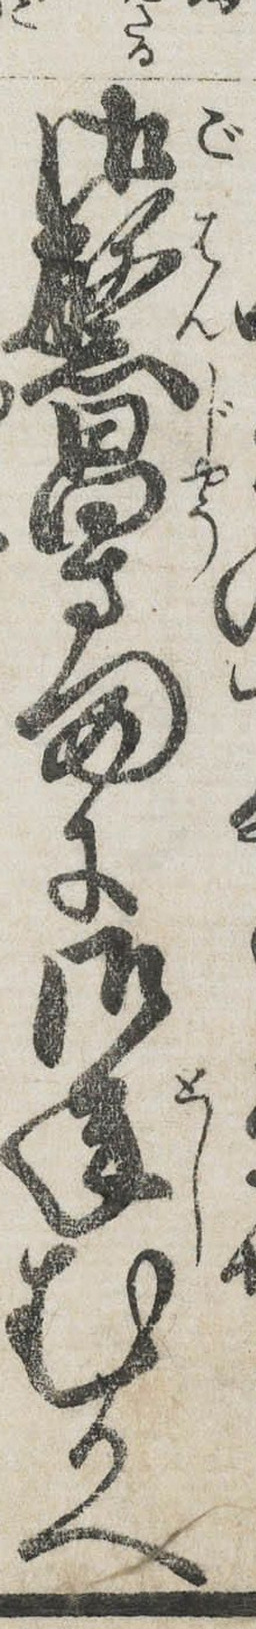御繁昌さまに御年むかへ
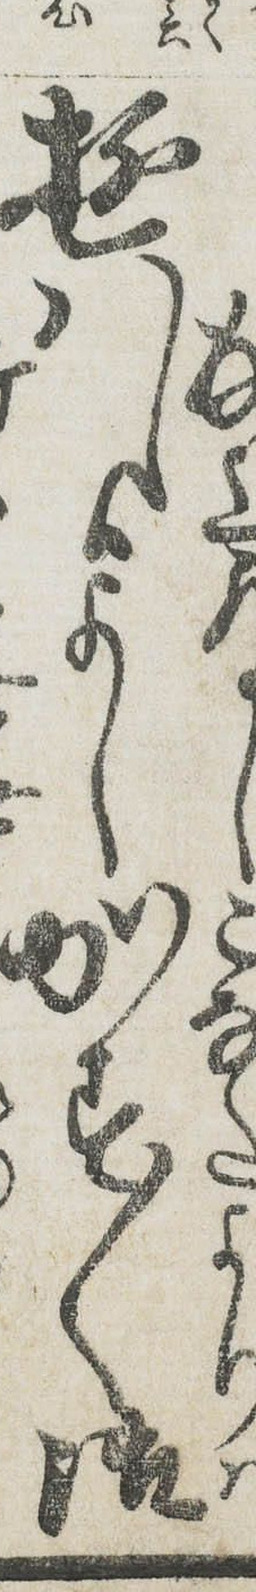遊はし候よしかす〳〵御
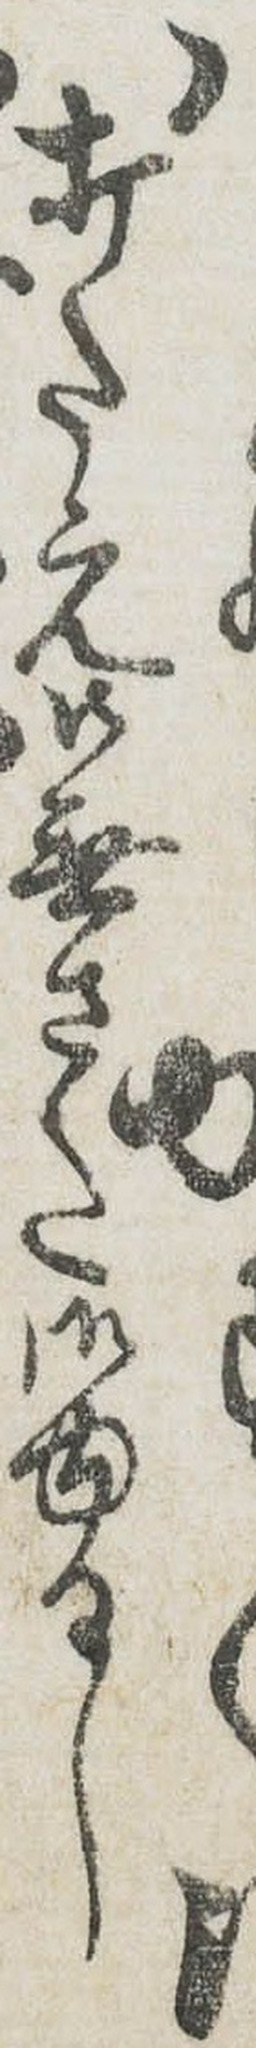折たえ御無さた御ゆるし
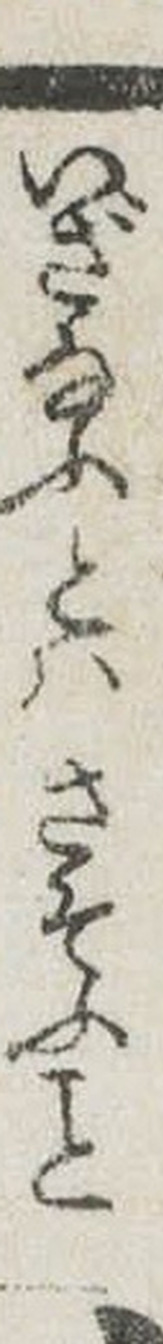いざなふとはさそふこと
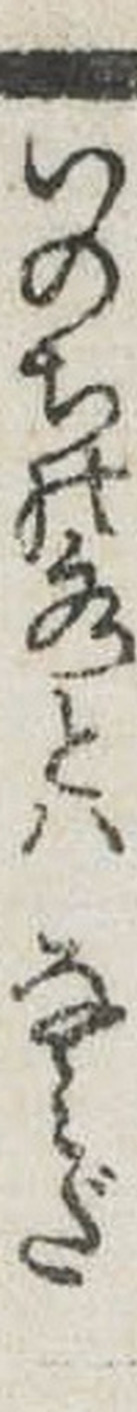いのちの水とはなみだ
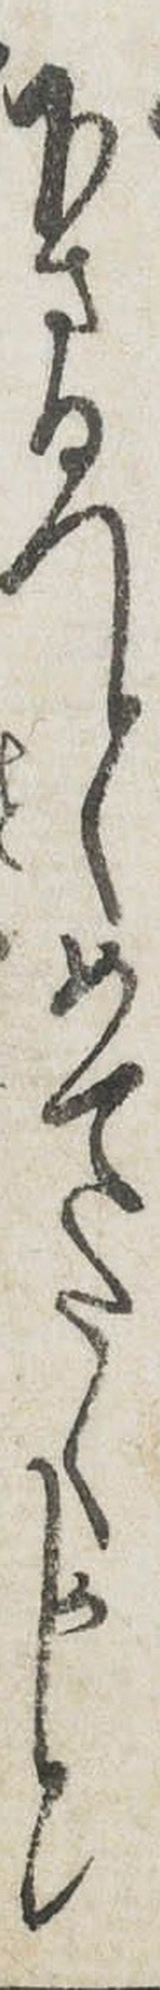下さるへく候めてたくかしく
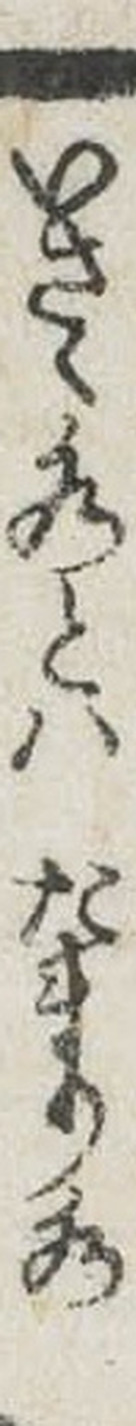いさゝ水とはたまり水
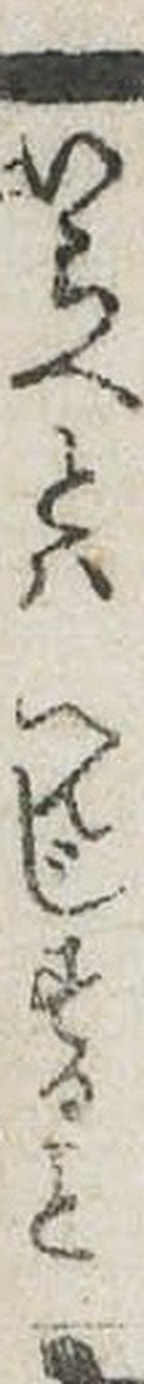いらへとはへんじすること
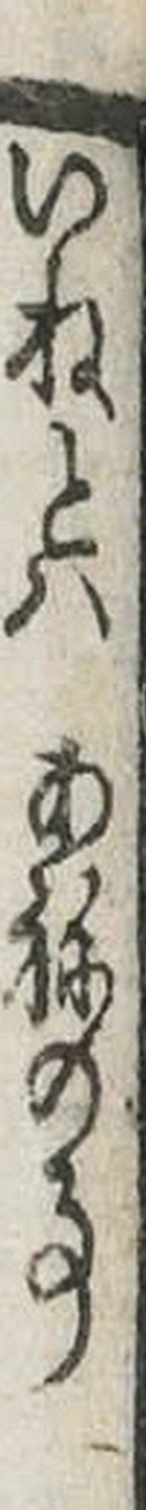いねとはあねの事
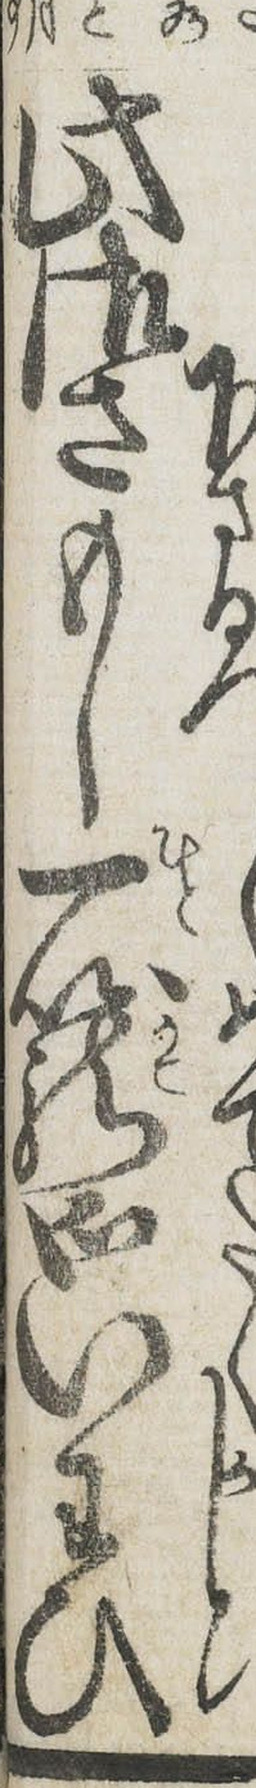此御さもし一籠御いわひ
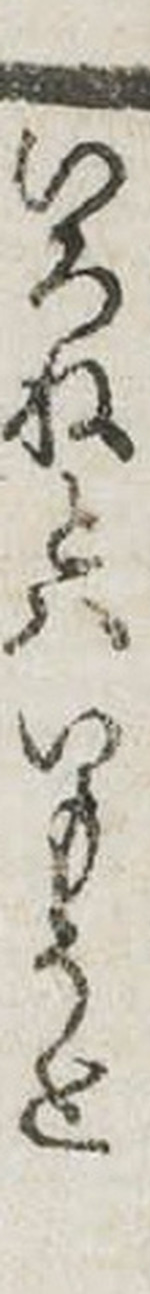いろねとはいもうと
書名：頭書萬用婦人手紙之文言
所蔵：東京学芸大学教育コンテンツアーカイブ
